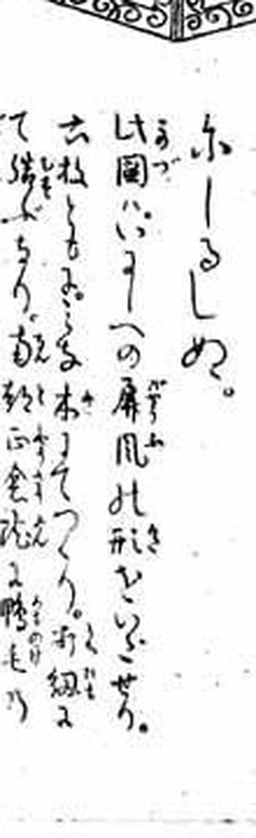五此図は。いにしへの屏風の形をいだせり。
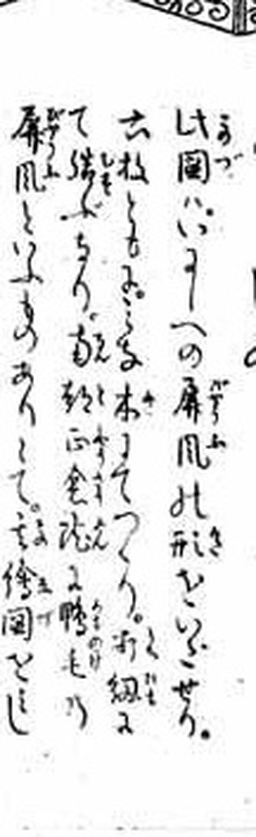六六枚ともに。木にてつくり。打紐に
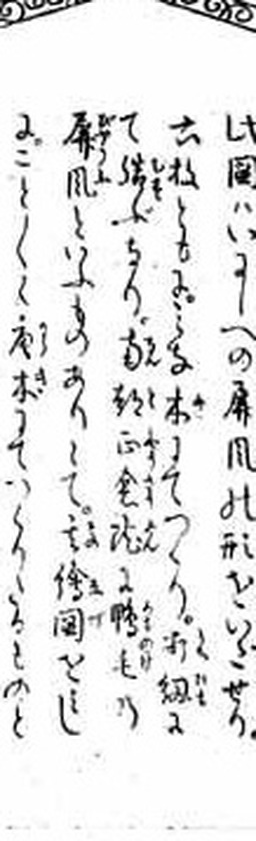て結ぶなり。南都正倉院に鴨毛の
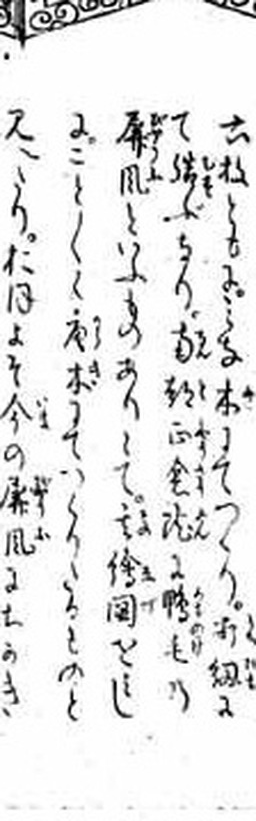七屏風といふものありとて。其絵図をみし
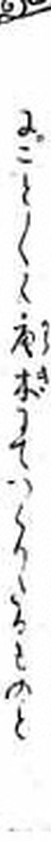九八に。こと〳〵く唐木にてつくりたるものと
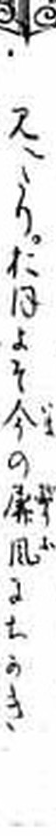十見えたり。おほよそ今の屏風にちかき
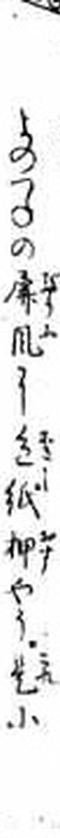十二よのつねの屏風に色紙押やう。是に
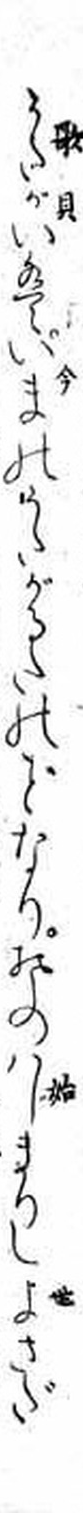うたがいは。いまのうたがるたのことなり。そのはじまりしよさだ
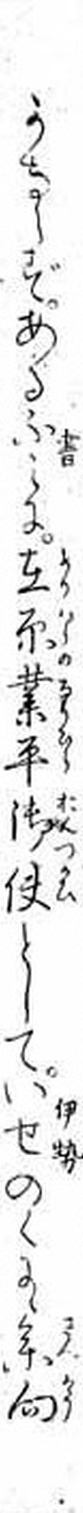かならず。あるふみに在原業平御使として。いせのくにゝ参向
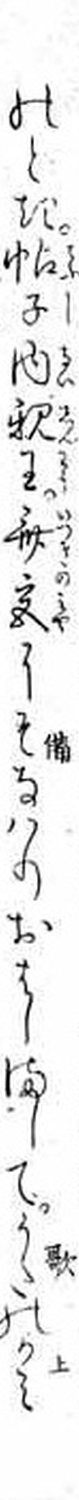のとき。帖子内親王。斎宮にそなはりおはしまして。うたのかみ
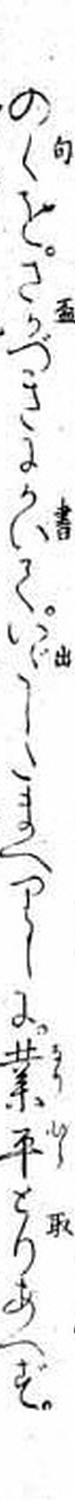のくを。さかづきにかいて。いだしたまへりしに。業平とりあへず。
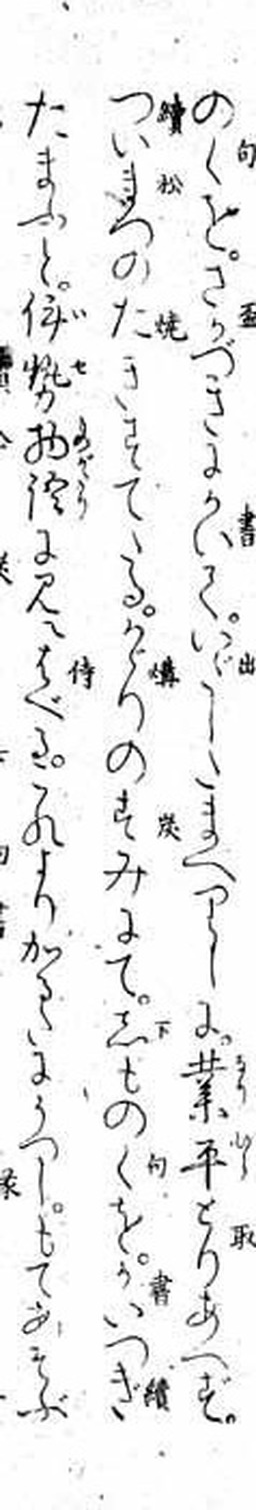ついまつのたきすてたる。かがりのすみにて。しものくを。かいつぎ
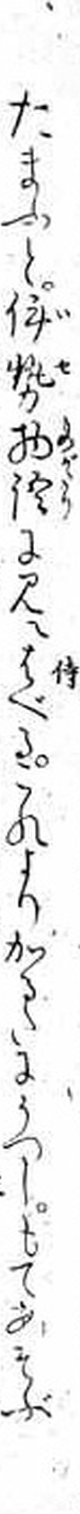たまふと。伊勢物語に見えはべる。これよりかるたにうつし。もてあそぶ
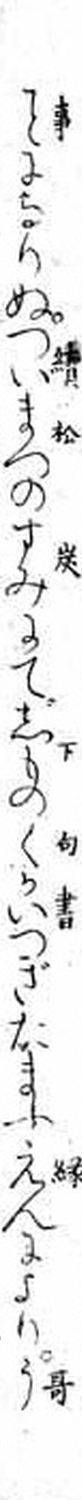ことになりぬ。ついまつのすみにて。しものくかいつぎたまふえんにより。う
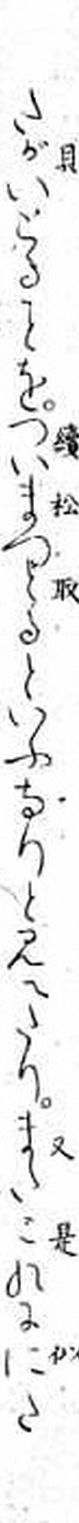たがいとることを。ついまつとるといふなりと見えたり。またこれににた
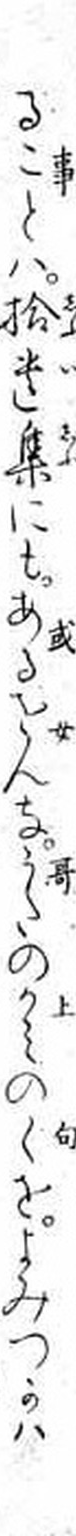ることは。拾遺集にも。あるをんな。うたのかみのくを。よみつかは
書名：女学範
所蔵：東京学芸大学教育コンテンツアーカイブ
